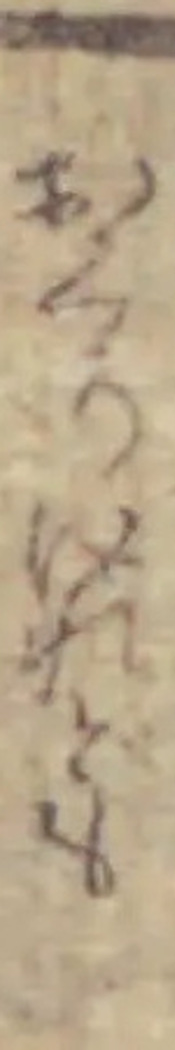おくりけれども
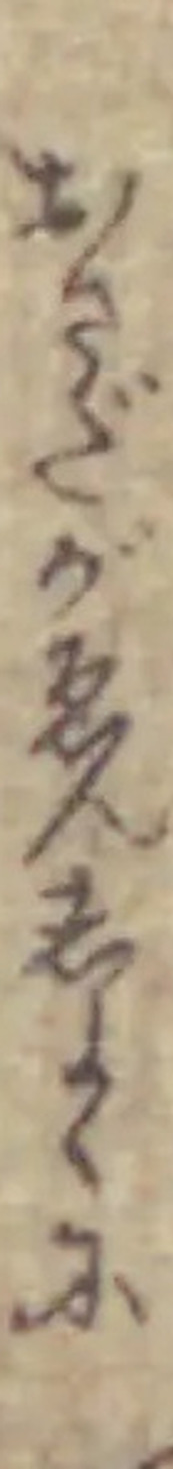おさだがゑんしよくに
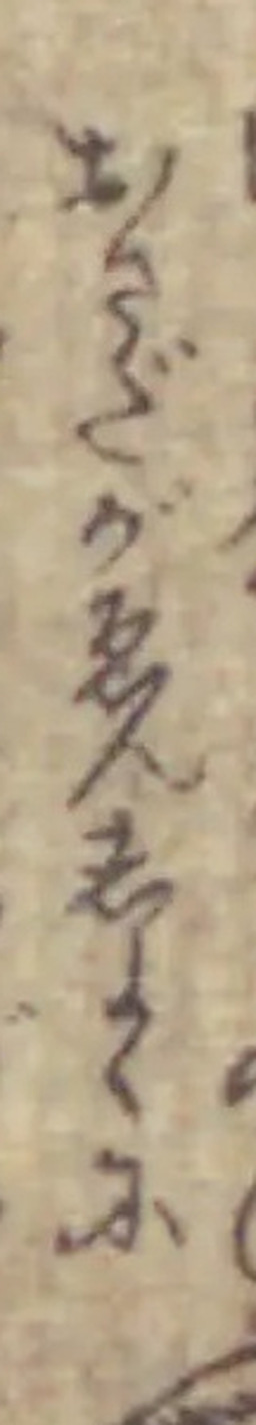おさだがゑんしよくに
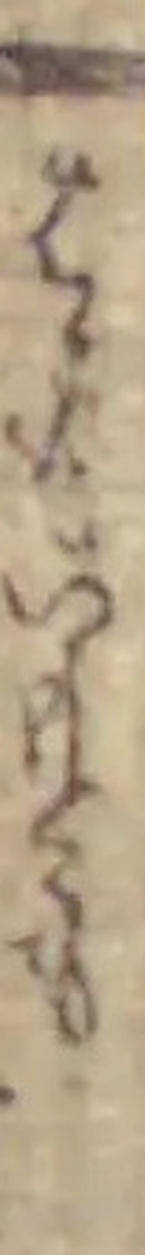はゝもいもとも
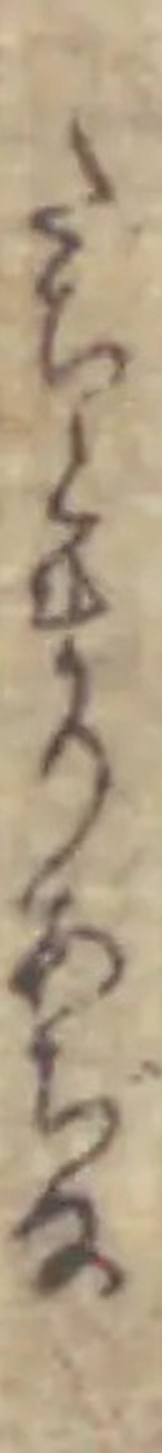たちとまりあぢな
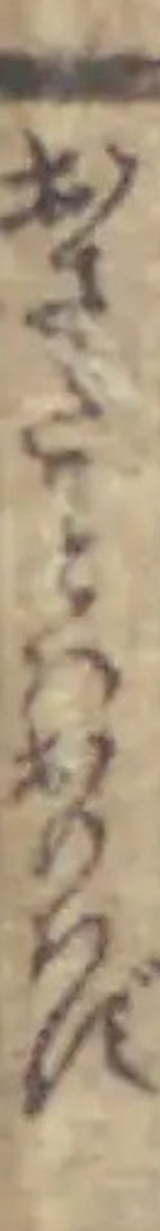おさたとはおもはず
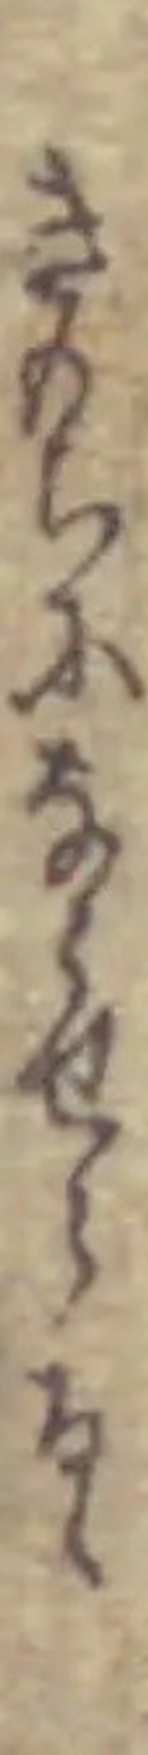きもちにならせらるゝ
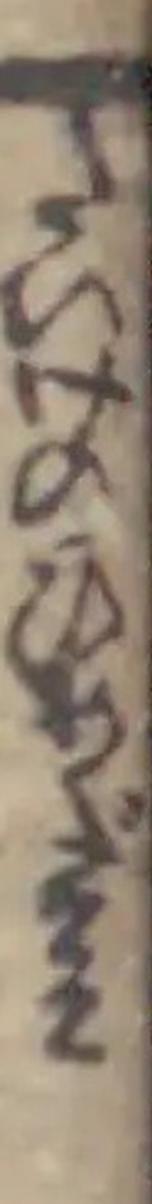たいけのひめぎみ
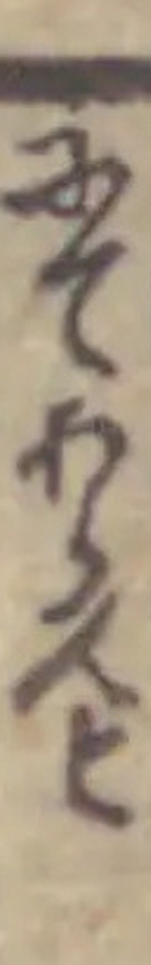にてあらんと
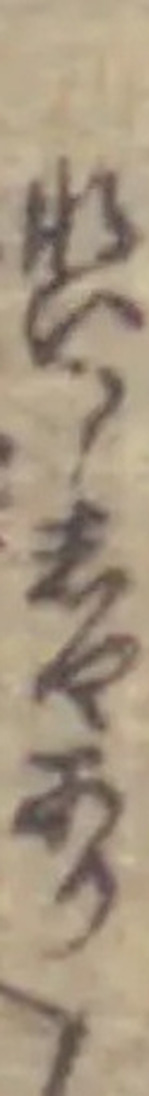れいしやあり
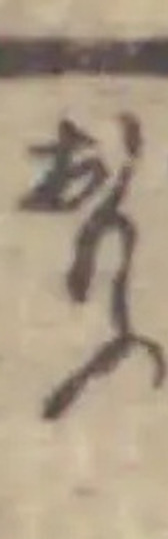おもふ
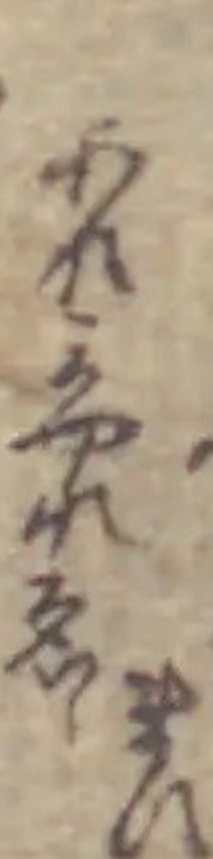あれみやれゑゝ
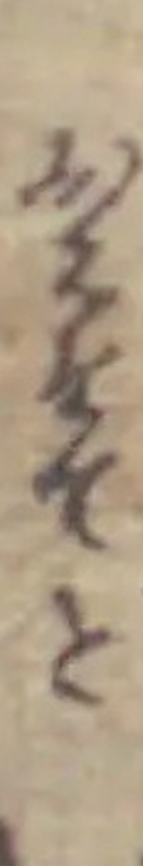おこそてを
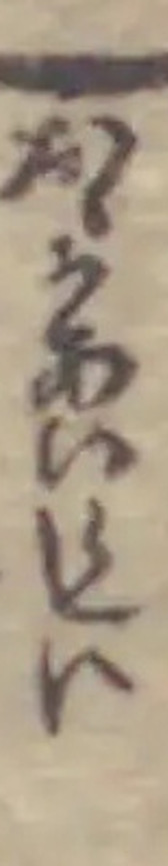おゝかあいらしい
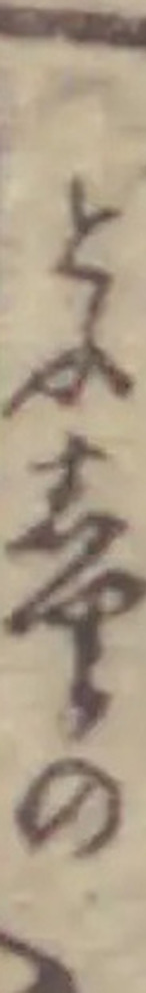とふしやうの

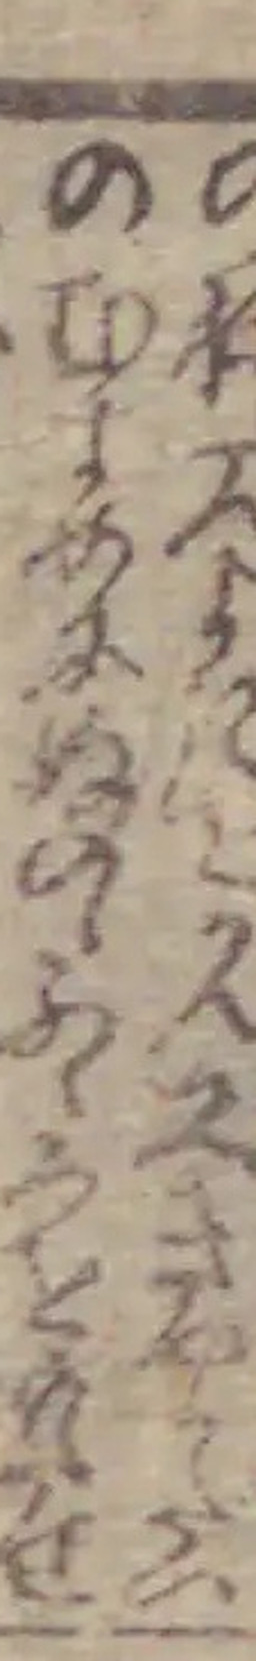のむすめにぬのゝふくろをもたせ
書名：奥州咄 3巻
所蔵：国立国会図書館 National Diet Library, JAPAN
